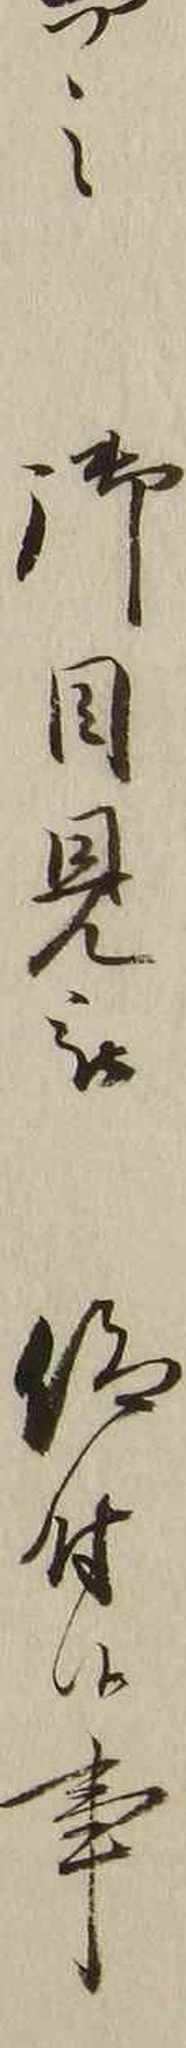而之御目見被仰付候事
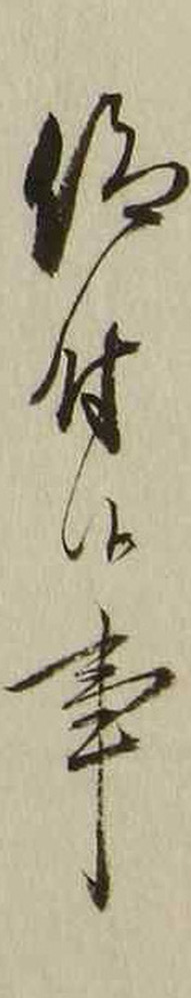仰付候事
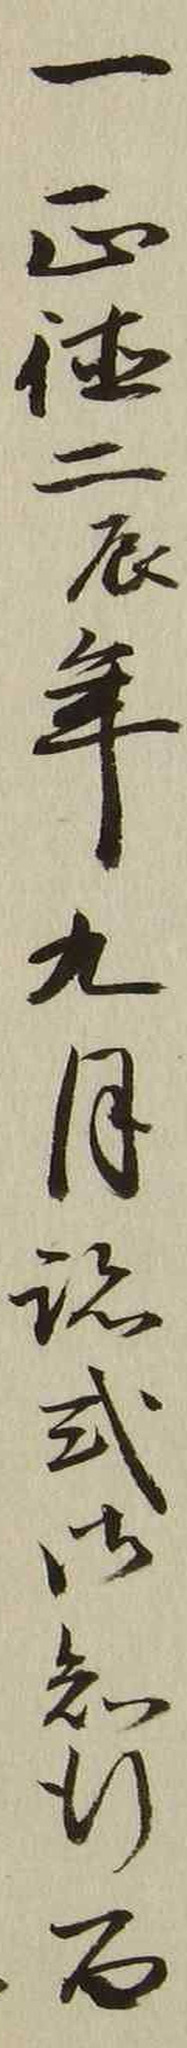一正徳二辰年九月跡式御知行百
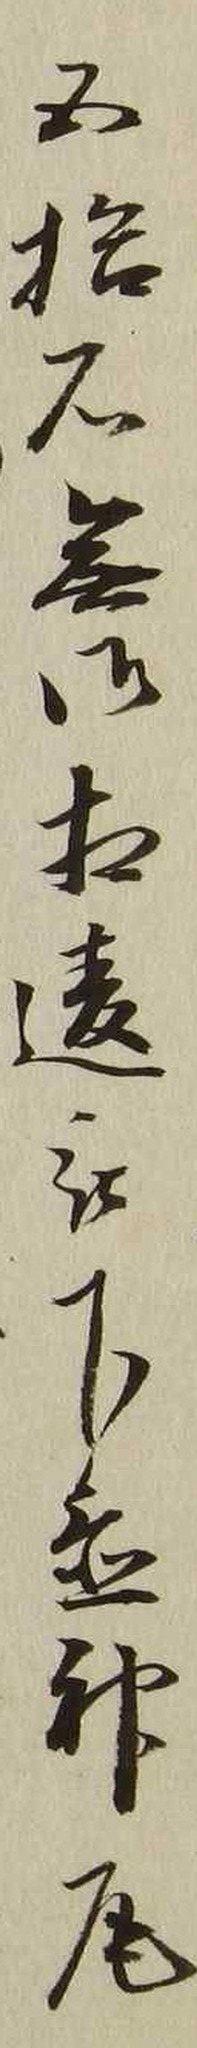五拾石無御相違被下置神尾
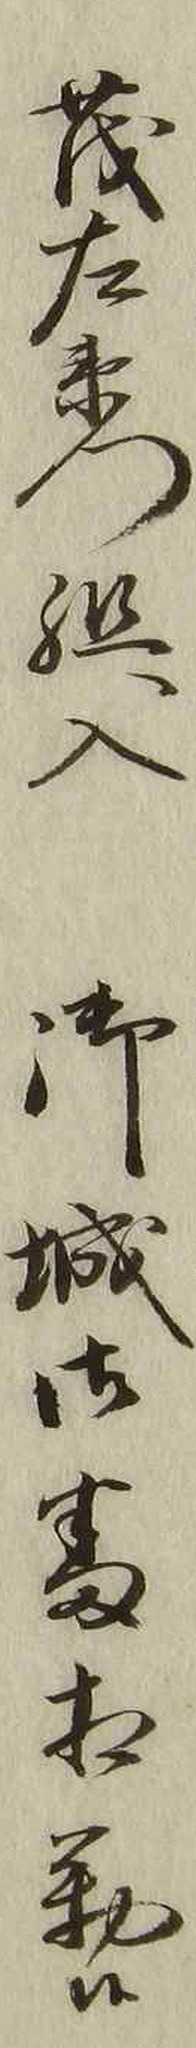茂左衛門組へ入御城御番相勤候
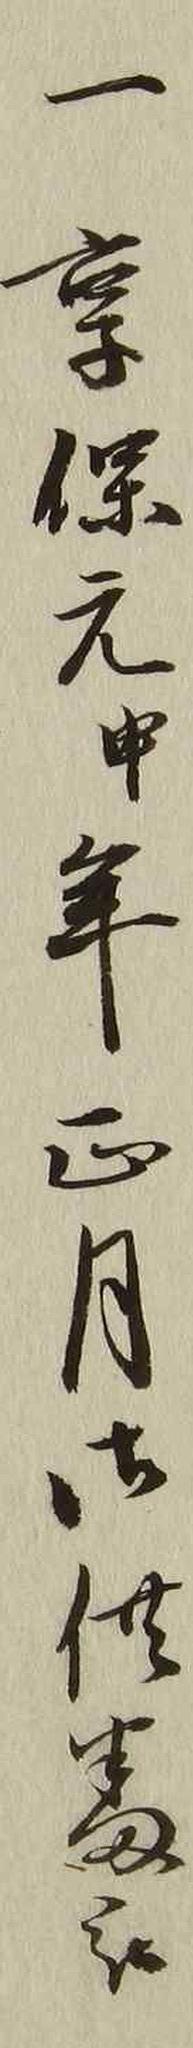一享保元申年正月御供番被
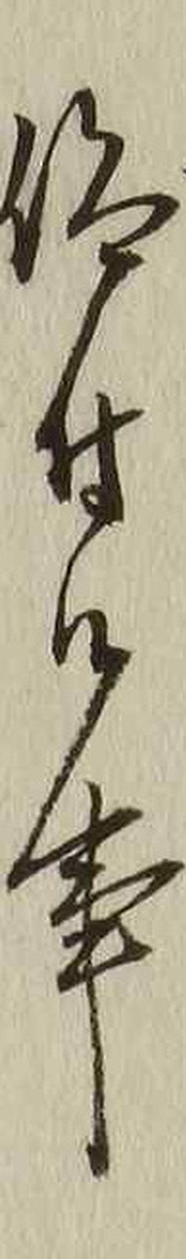仰付候事
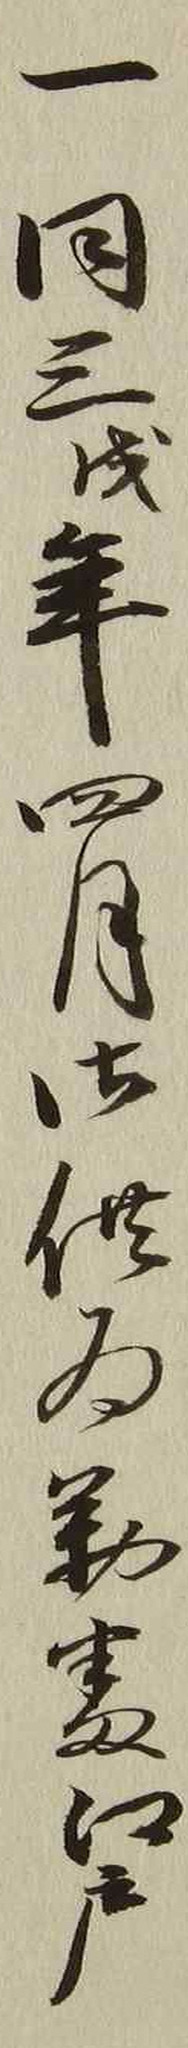一同三戌年四月御供為勤番江戸
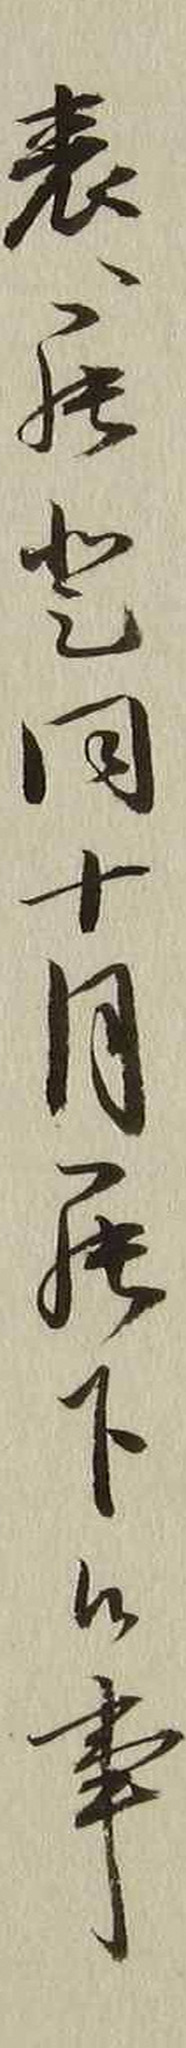表へ罷登同十月罷下候事
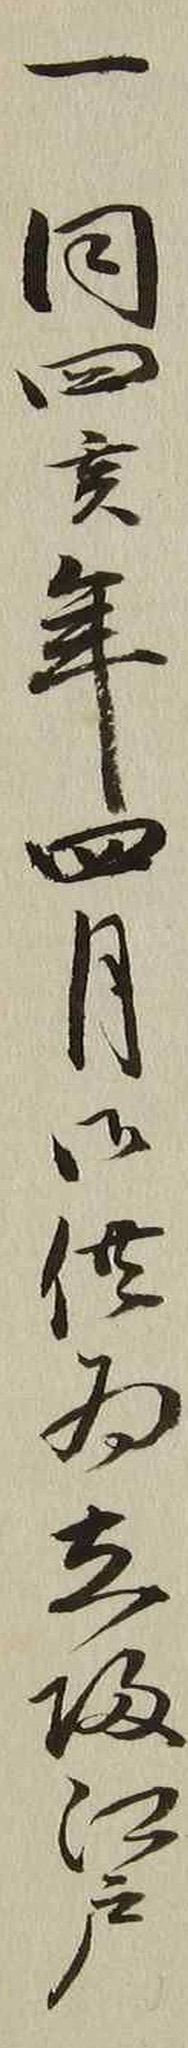一同四亥年四月御供為立帰江戸
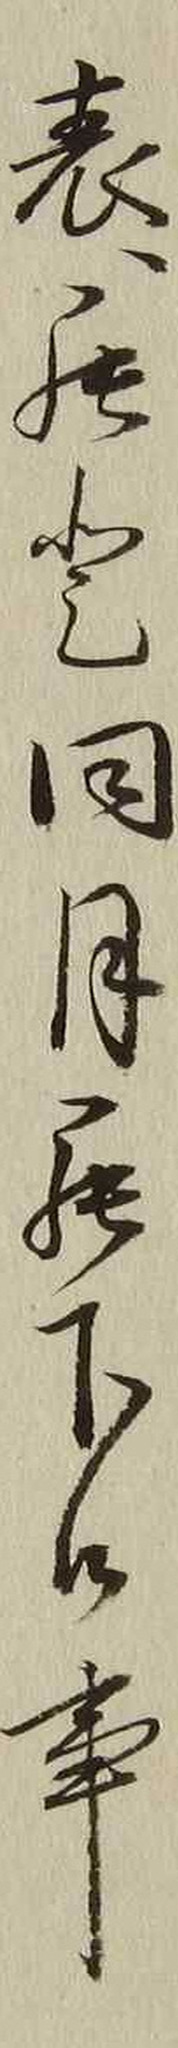表へ罷登同月罷下候事
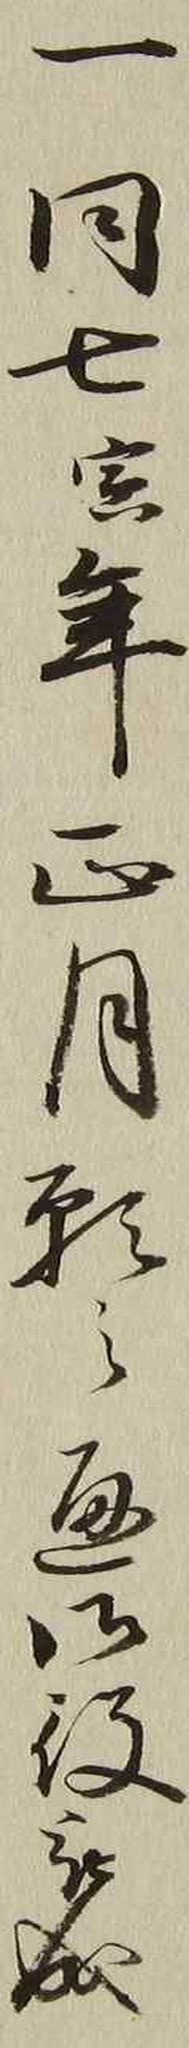一同七寅年正月願之通御役被成
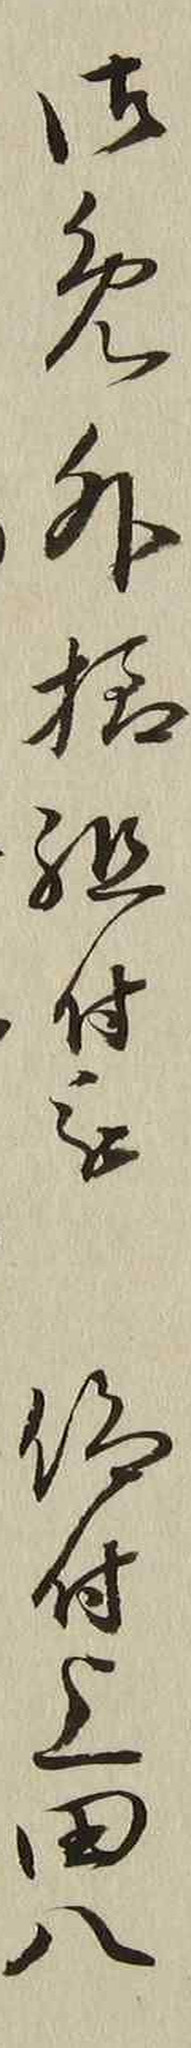御免外様組付被仰付上田八
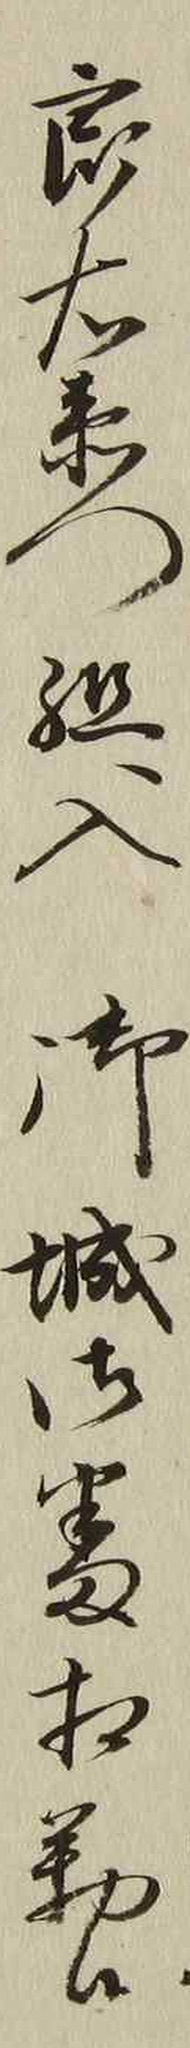郎右衛門組へ入御城御番相勤候
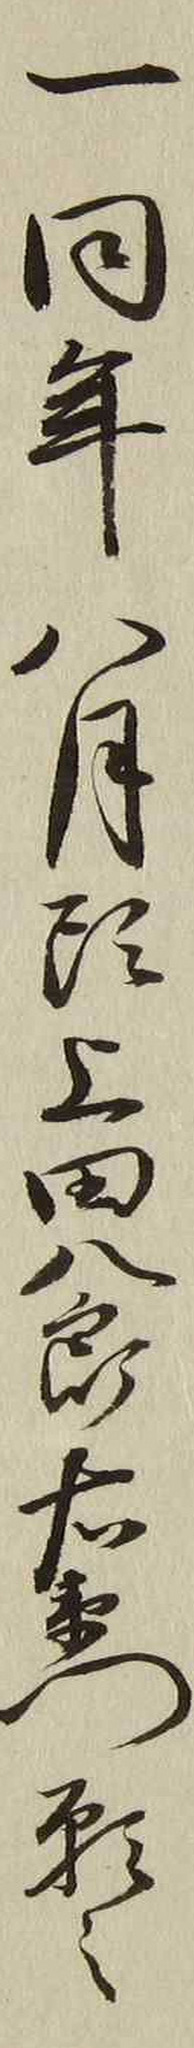一同年八月頭上田八郎右衛門願之
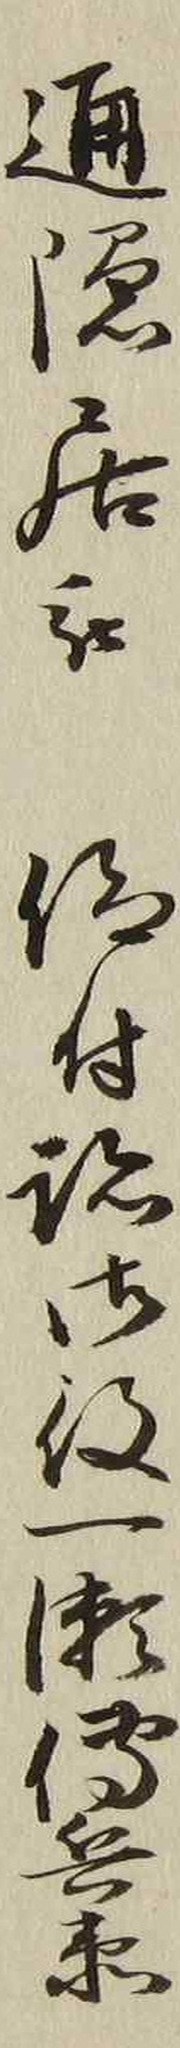通隠居被仰付跡御役一瀬伝兵衛
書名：諸士系譜　巻之61　と之部4
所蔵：会津若松市立会津図書館
